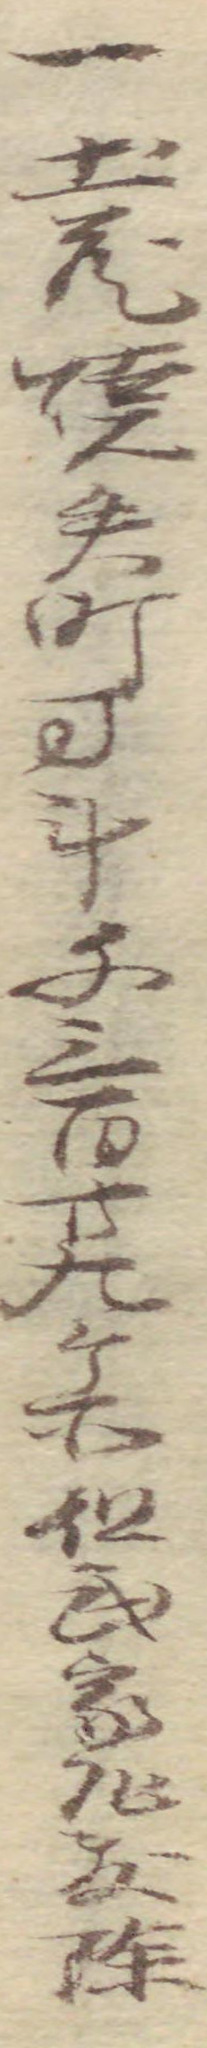一土蔵焼失町方斗千三百廿九ケ所但武家屋敷除
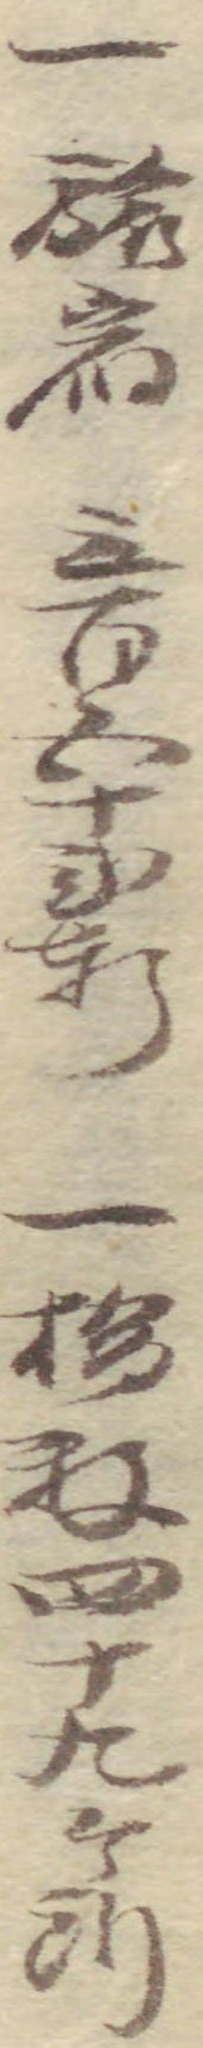一旅宿三百五十弐軒一橋数四十九ケ所
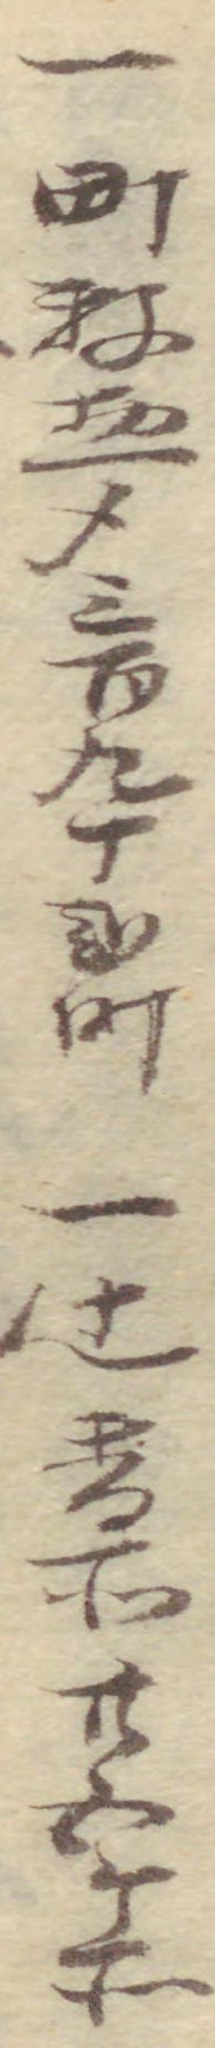一町数惣〆三百九十弐町一辻書所廿五ケ所
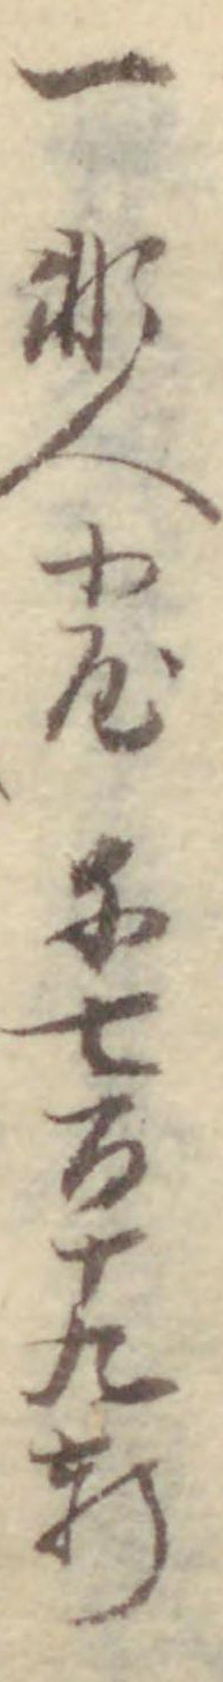一非人小屋千七百十九軒
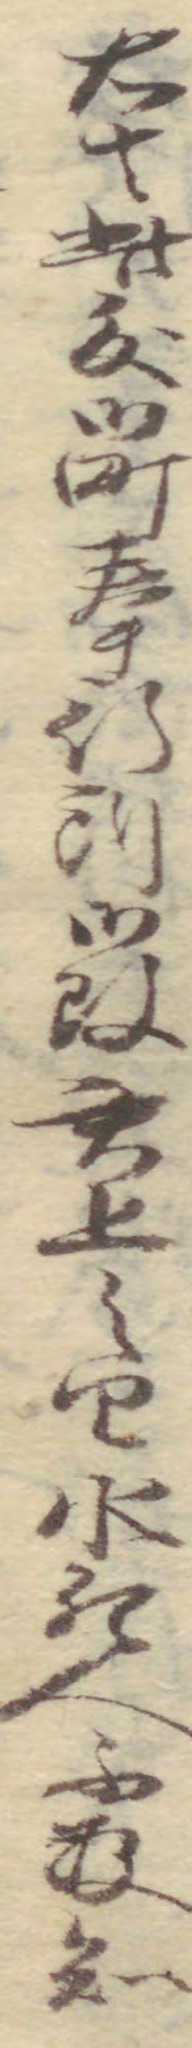右は此度御町奉行所御改書上之由水死人不数知
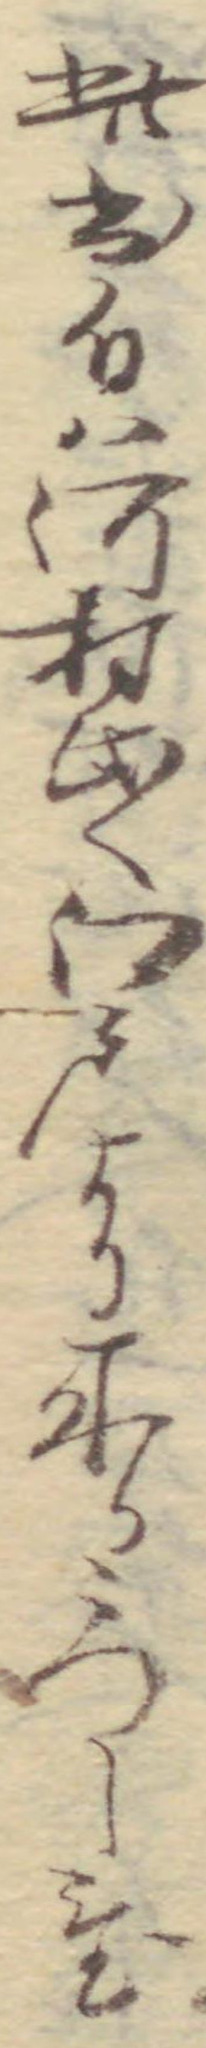此書付ハ河村氏へ江戸より来りうつし置
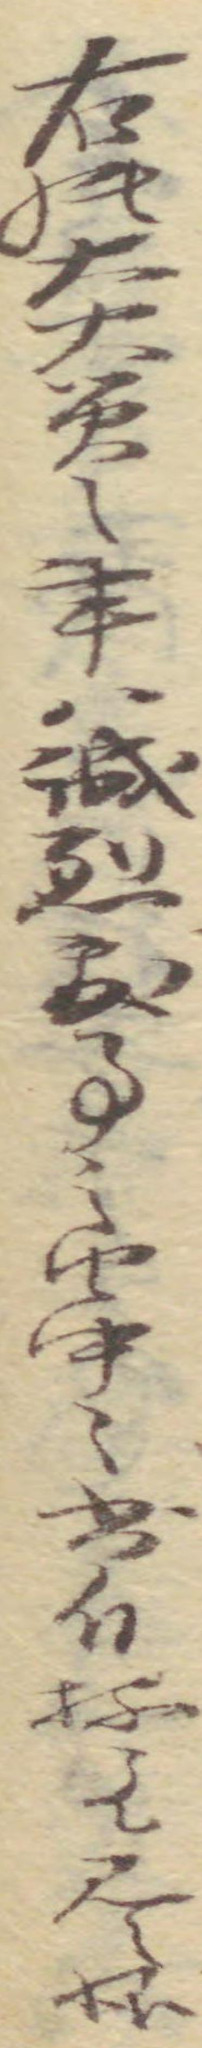右の大火災之事ハ誠烈敷事之由中々書付抔ニて見候様
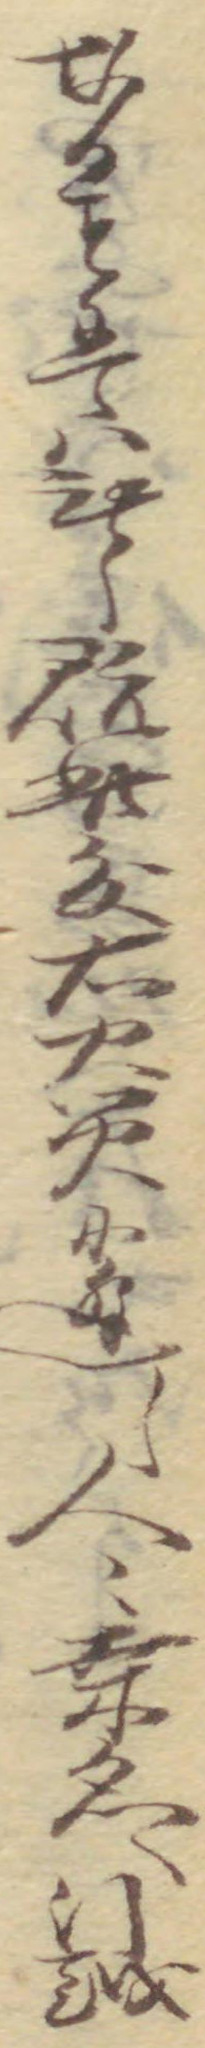なることにてハ無之既此度右大火災に逢し人々桑名へ引越
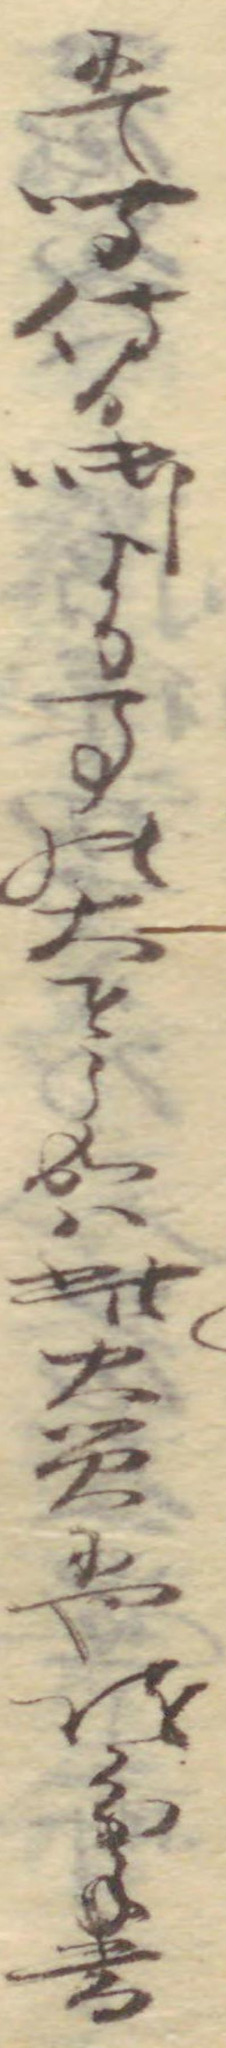にて聞伝る咄しより事の大こと之成ハ此火災にや随分手当
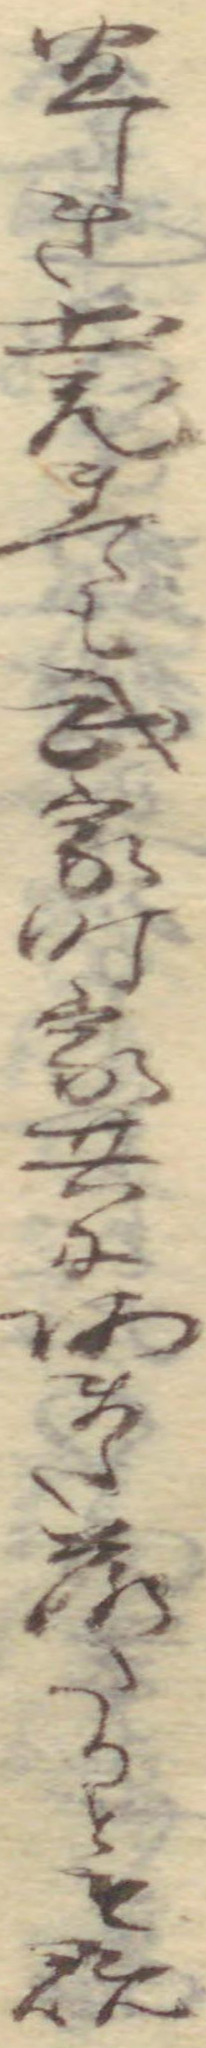宜しき土蔵まても武家町家共にあまた落たりとそ既
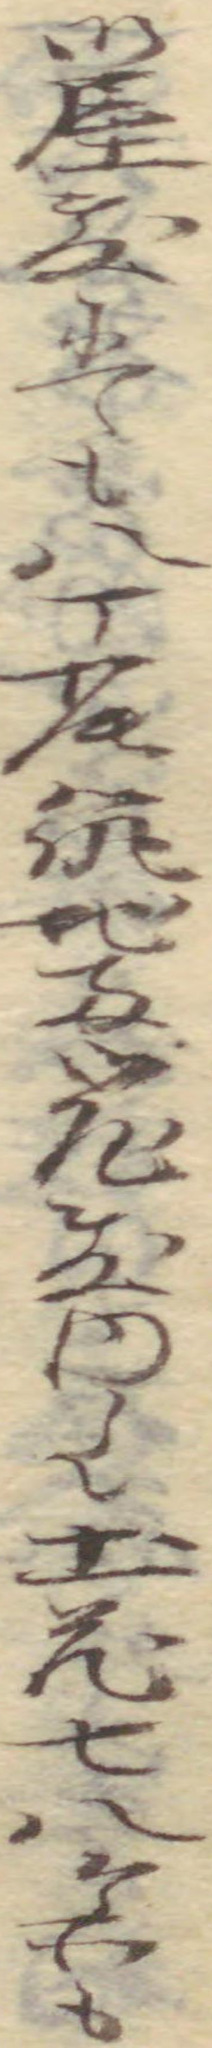御屋敷にても八丁堀築地両御屋敷内ニて土蔵七八ケ所も
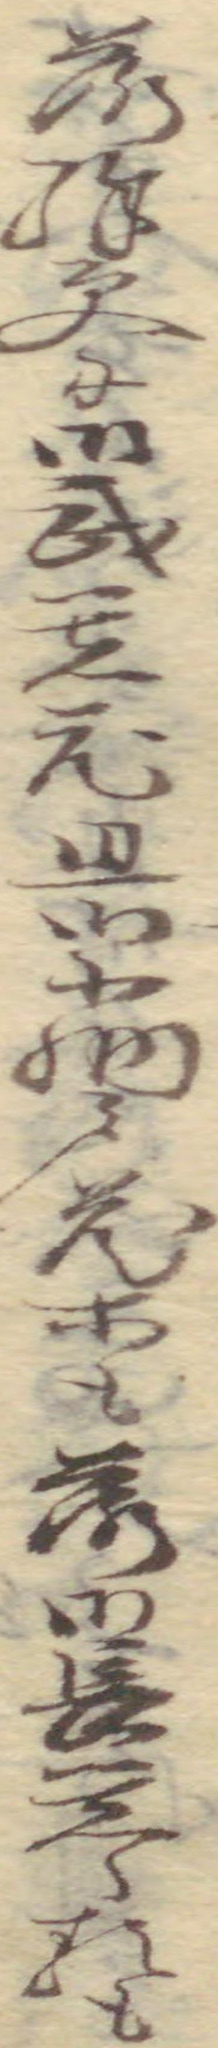落殊更に御武器蔵辺且御小納戸蔵等も落御長器之類も
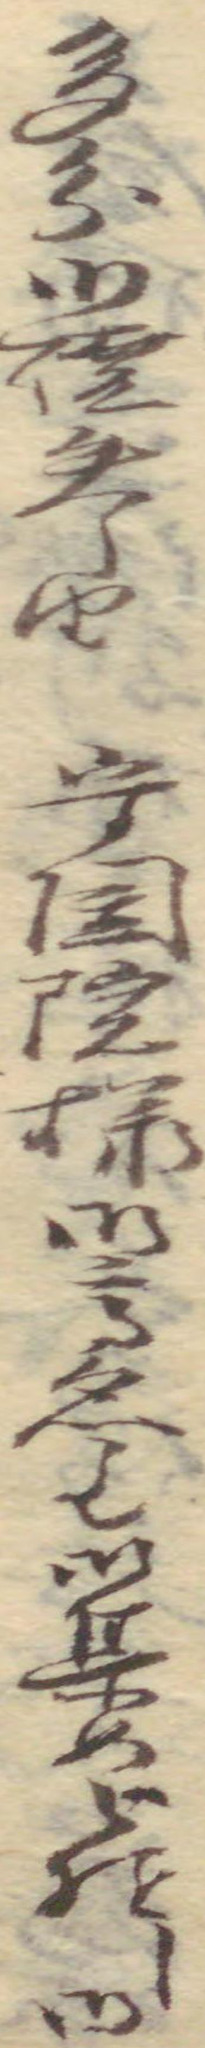多分御焼失候由守国院様御高名ニて御集め被遊し御
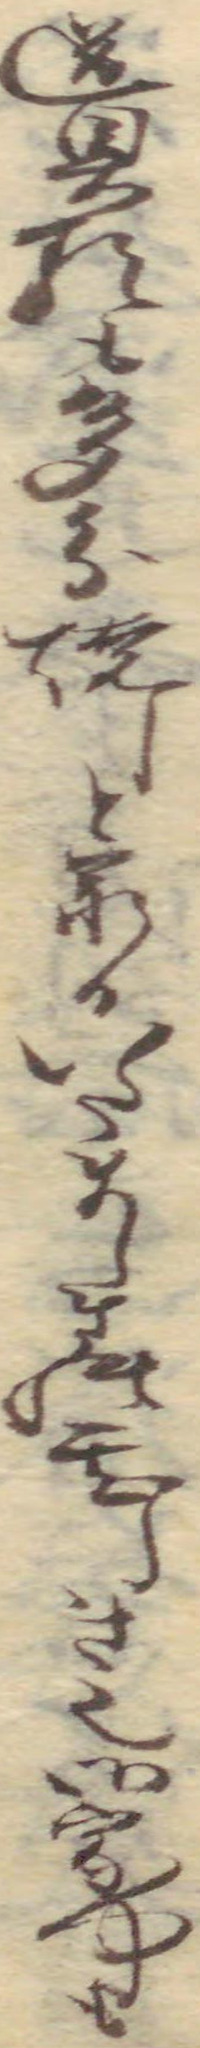道具類も多分焼候と承りいたましさの甚しき也御家中も
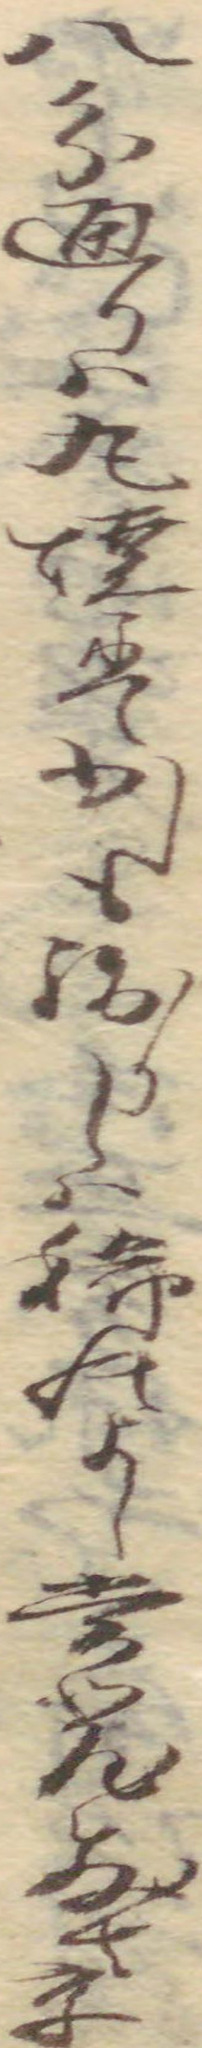八分通りハ丸焼にて少しも残りしハ稀のよし当御屋敷は享
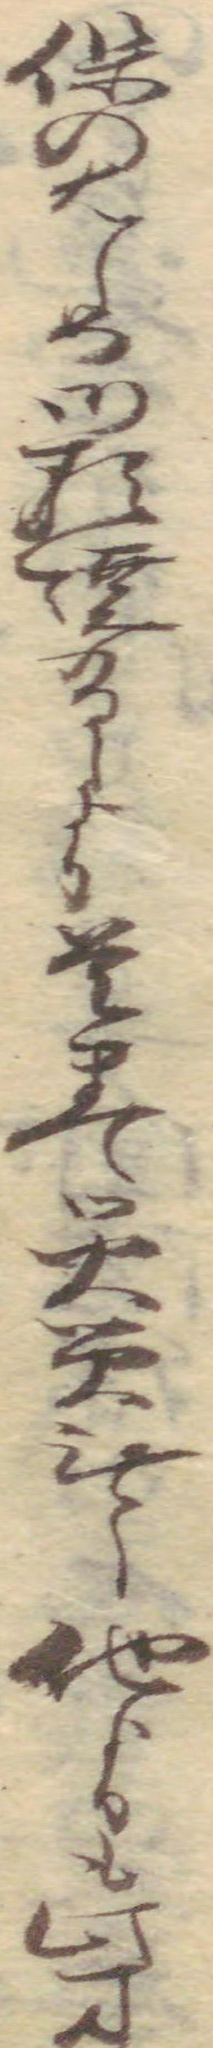保のはしめ御類焼有之より是まて御火災無之他よりも此方
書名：鶯宿雑記. 巻199-200
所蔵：国立国会図書館 National Diet Library, JAPAN
